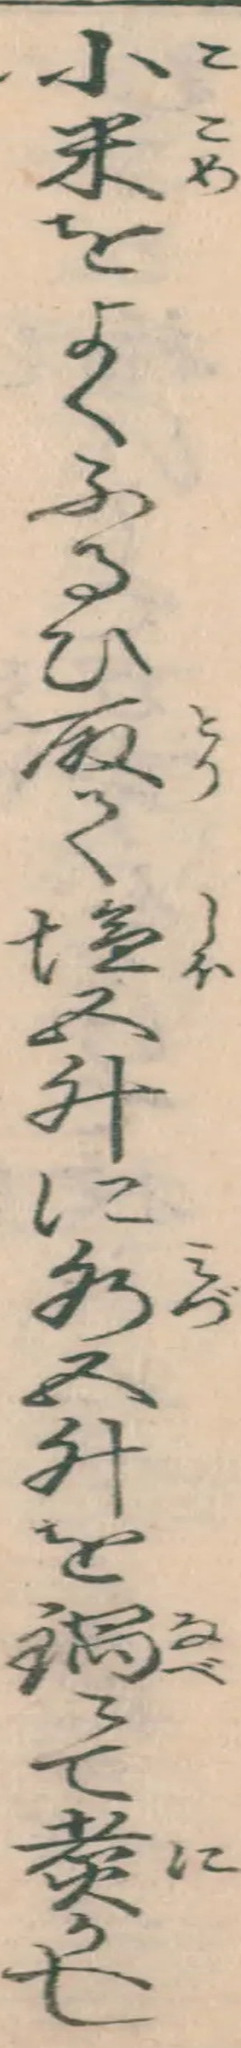小米をよくふるひ取て塩五升に水五升を鍋にて煮かへし
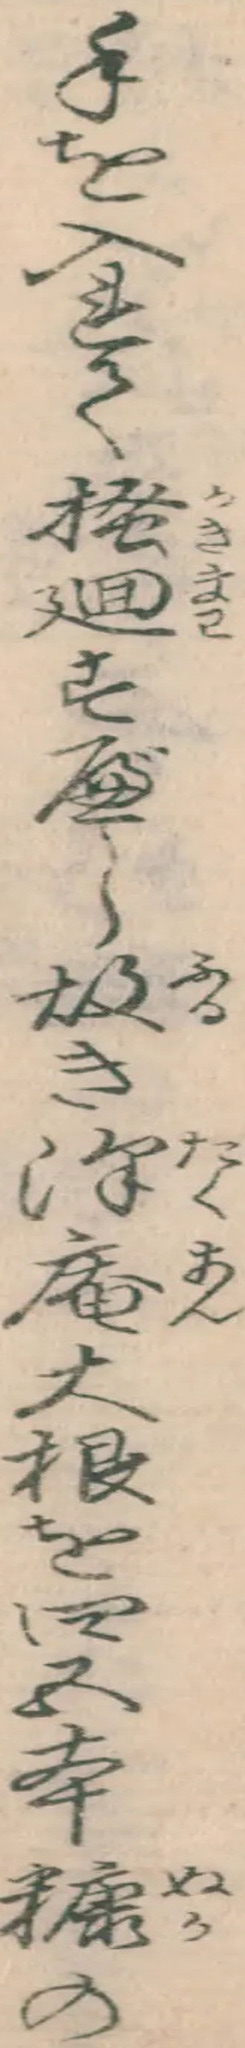手を入れて掻廻すべし故き沢庵大根を四五本糠の
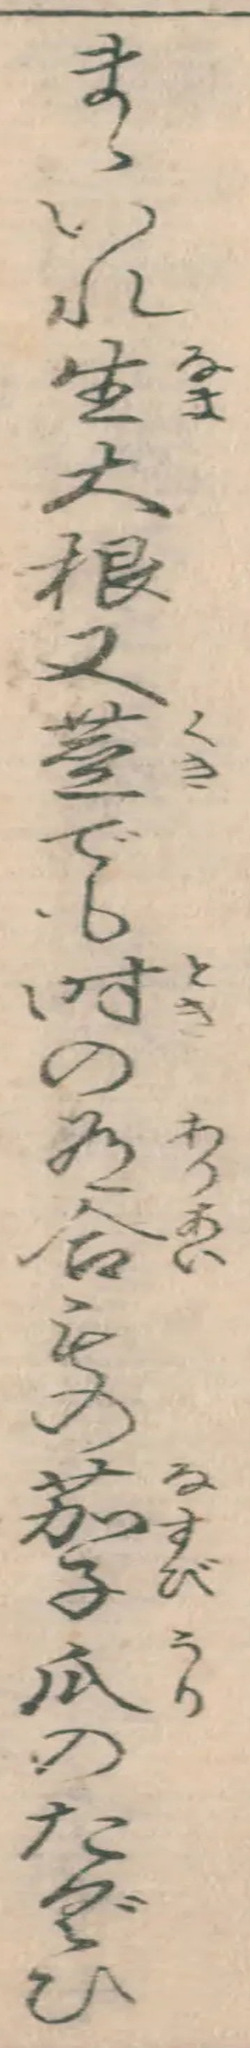まゝいれ生大根又茎でも時の有合もの茄子瓜のたぐひ
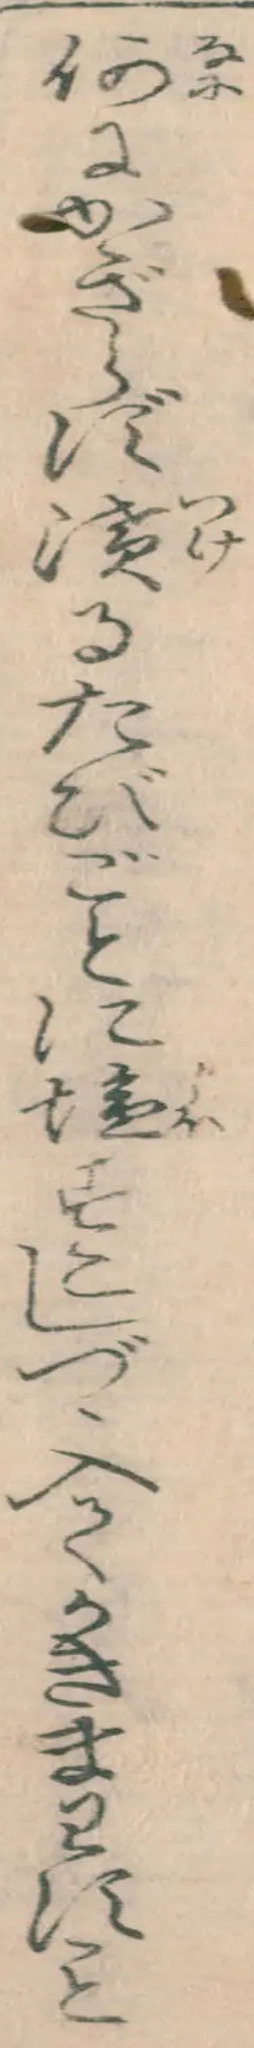何にかぎらず漬るたびごとに塩すこしづゝ入てかきまわすこと

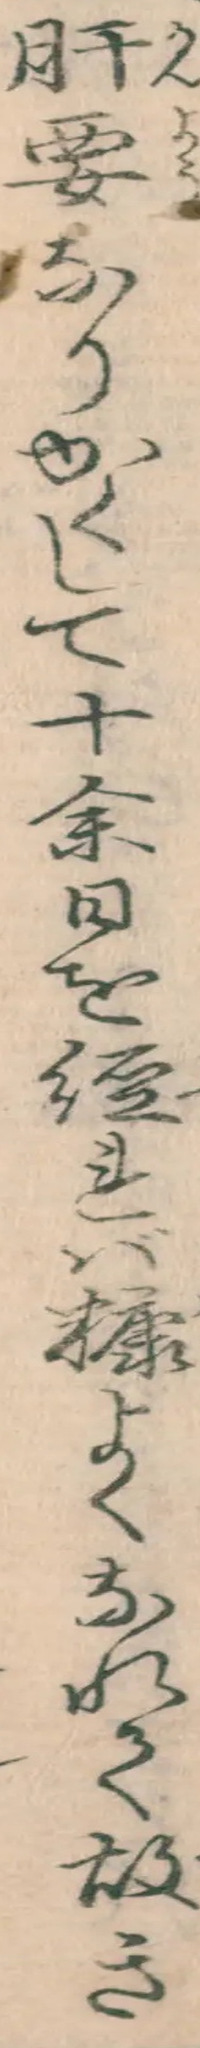肝要なりかくして十余日を経れば糠よくなれて故き
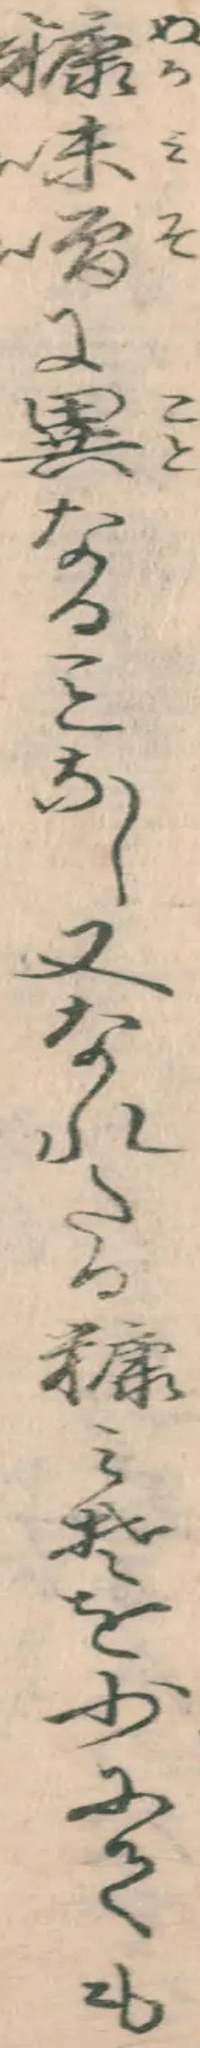糠味噌に異なることなし又なれたる糠みそを少にても
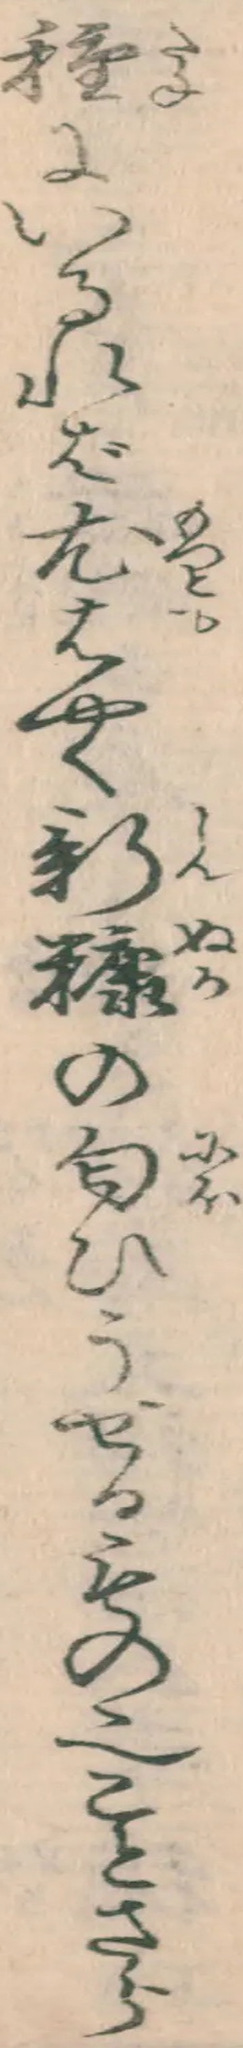種にいるれば尤はやく新糠の匂ひうぜるもの也ことさら
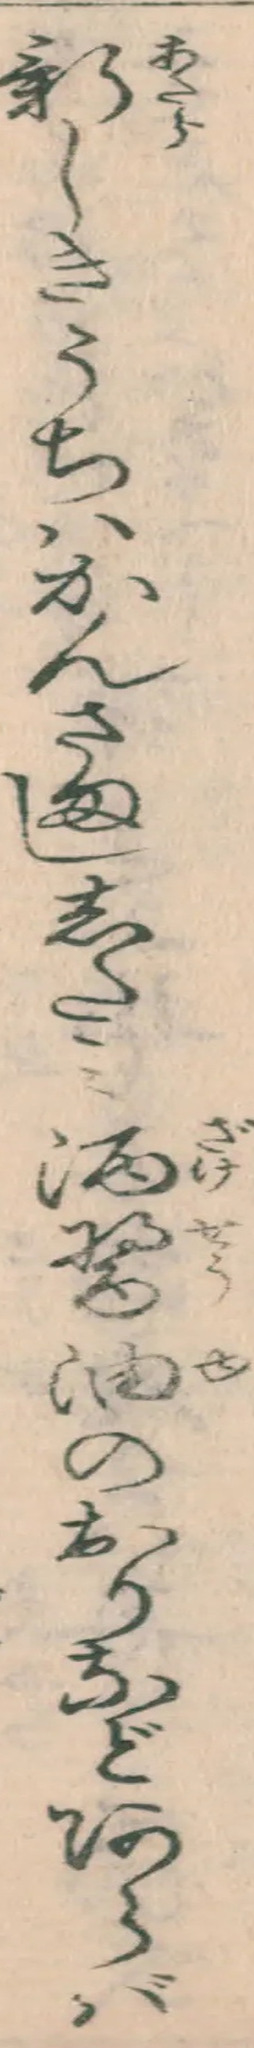新しきうちはかんさまししたみ酒醤油のおりなどあらば
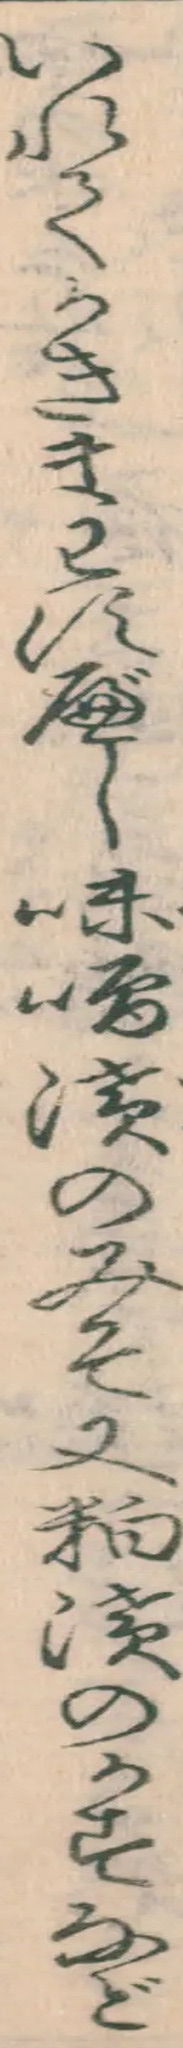いれてかきまわすべし味噌漬のみそ又粕漬のかすなど
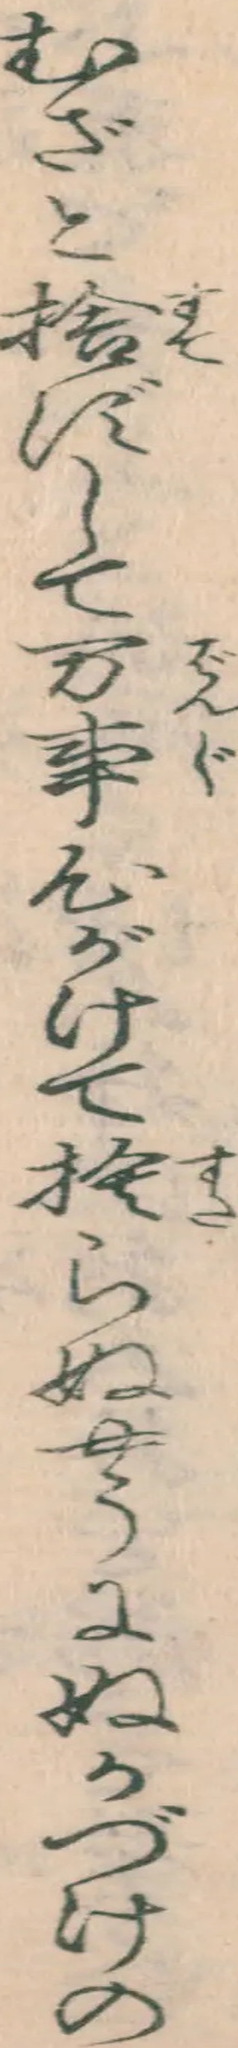むざと捨ずして万事心がけて捨らぬやうにぬかづけの
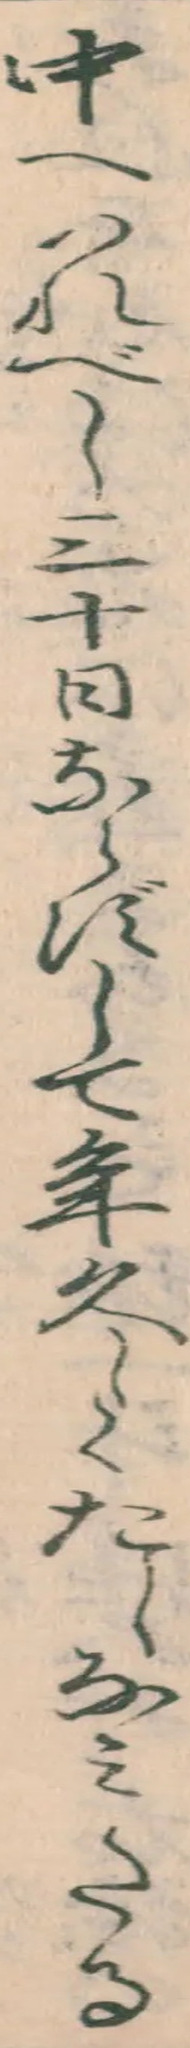中へいれべし三十日ならずして年久しくたしなみたる
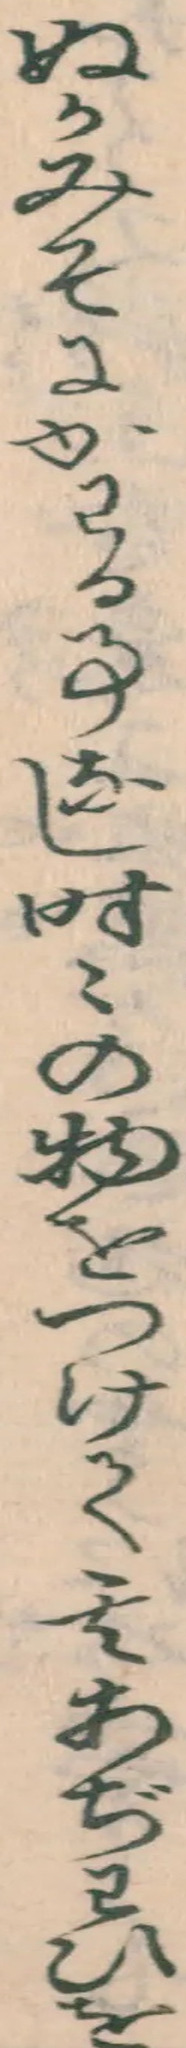ぬかみそにかわる事なし時々の物をつけて其あぢわひを
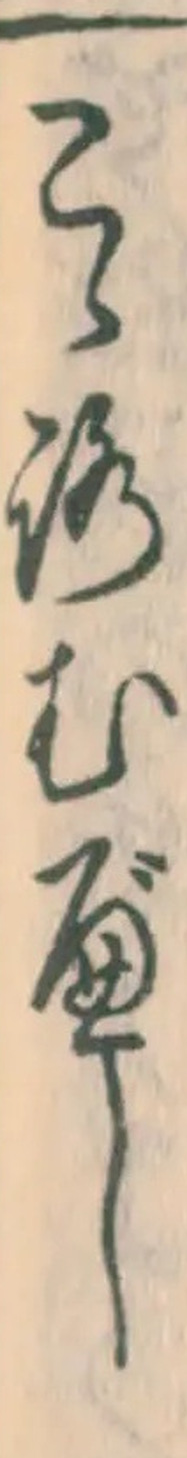こゝろむべし
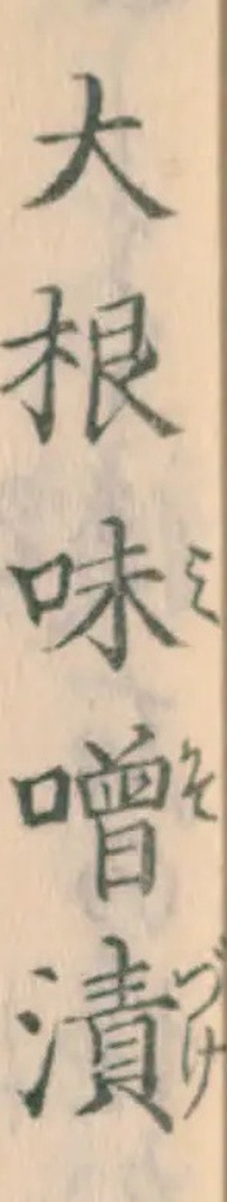大根味噌漬
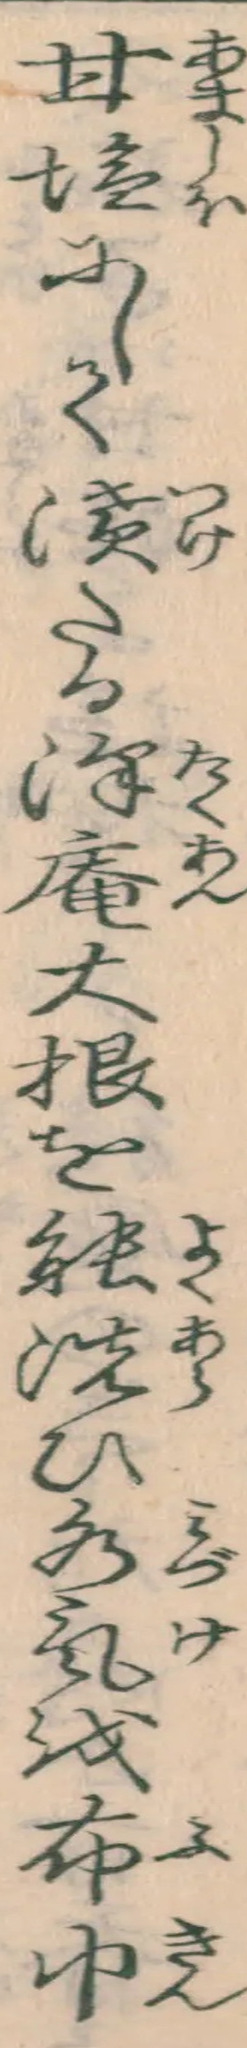甘塩にして漬たる沢庵大根を能洗ひ水気を布巾
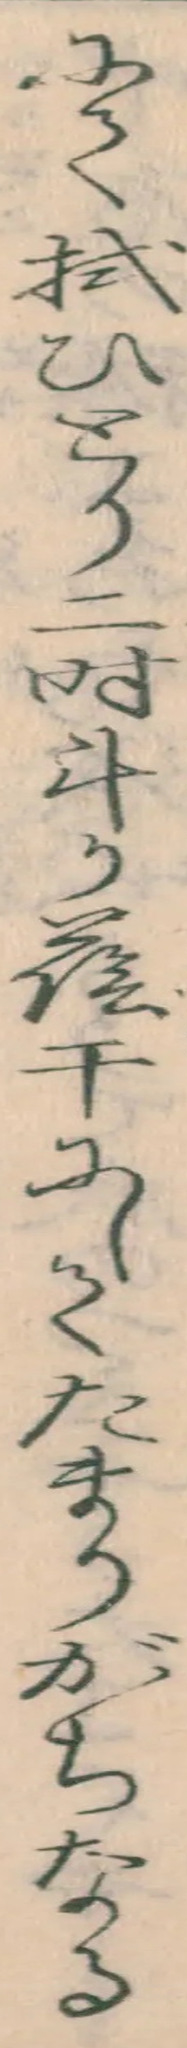にて拭ひとり二時斗り陰干にしてたまりがちなる
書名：四季漬物鹽嘉言
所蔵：国立国会図書館 National Diet Library, JAPAN
